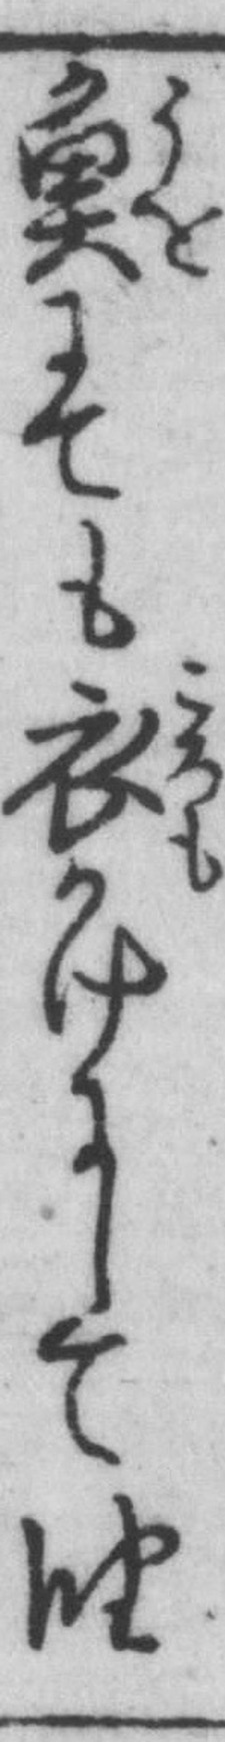魚にても衣かけにして
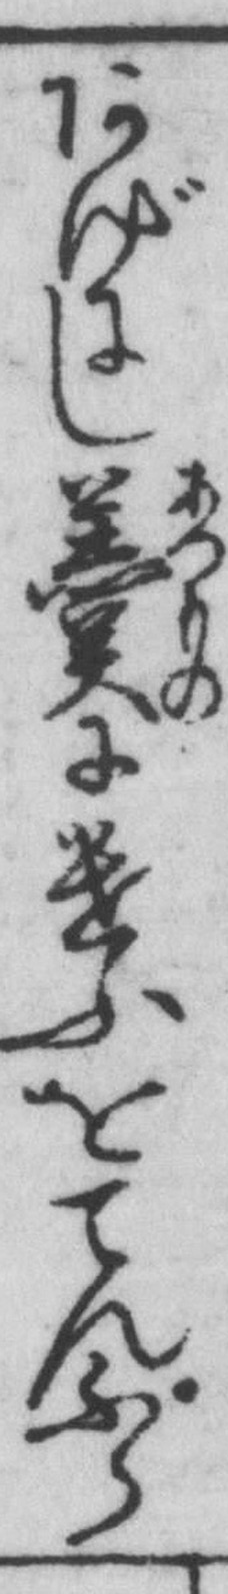あげにし羹に遣ふをてんぷら
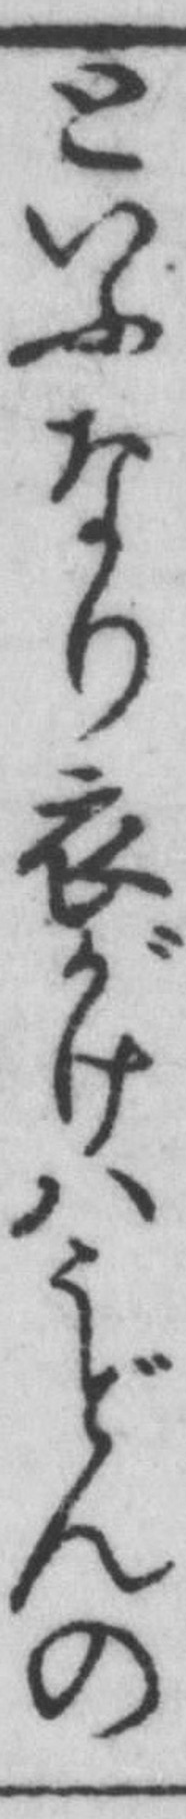といふなり衣がけハうどんの
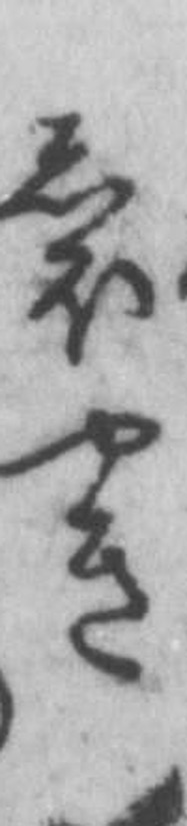しほやき
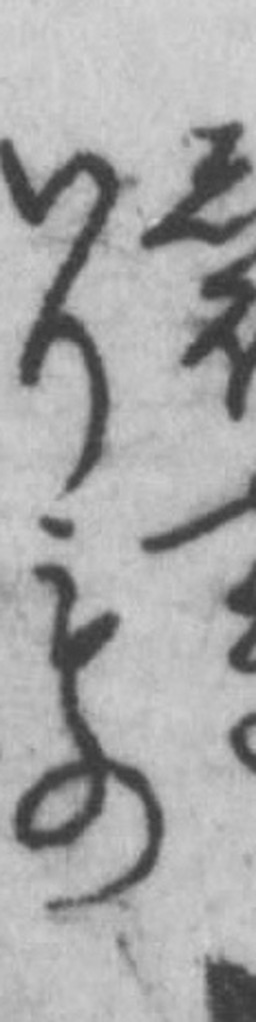いりもの
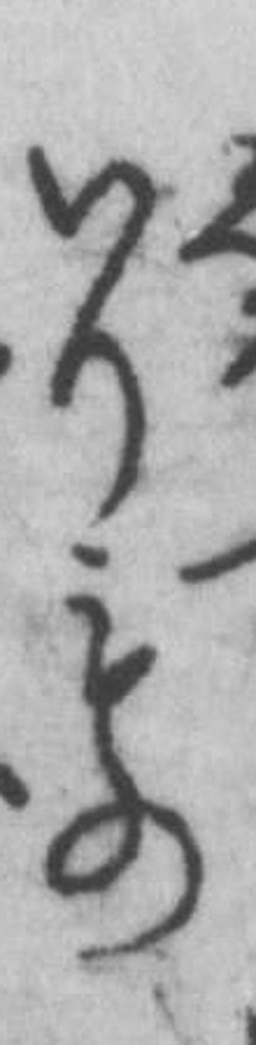いりもの
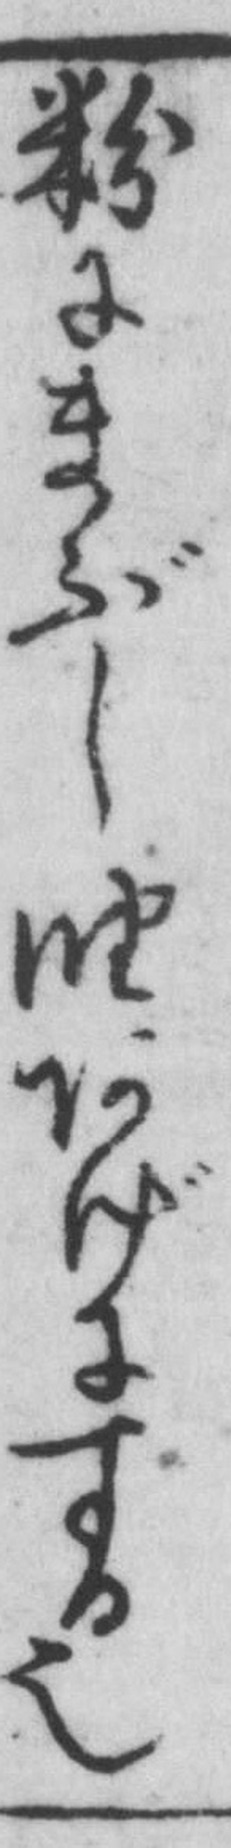粉をまぶしあげにする也
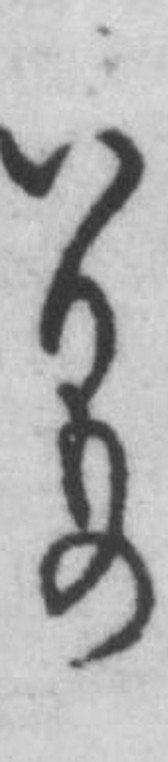いりもの
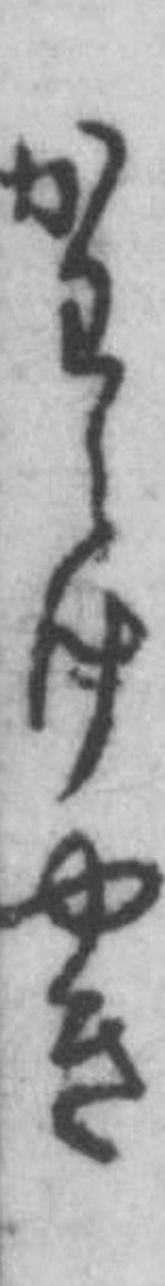かわたけやき
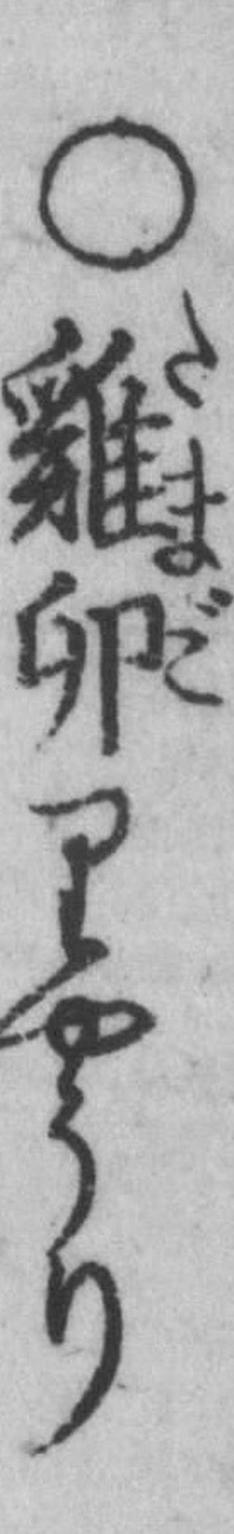〇鶏卵りやうり
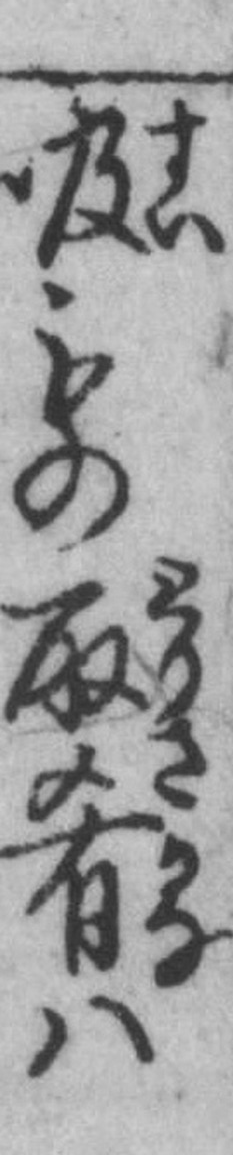吸もの取肴ハ
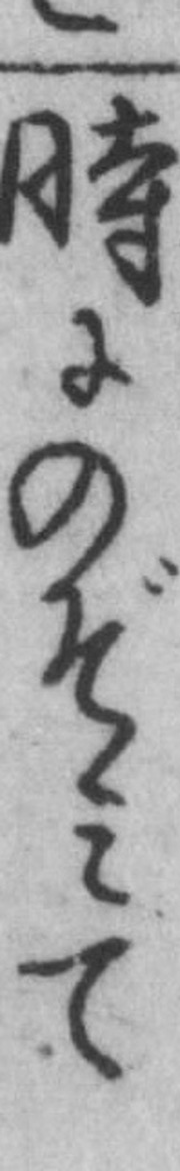時にのぞミて
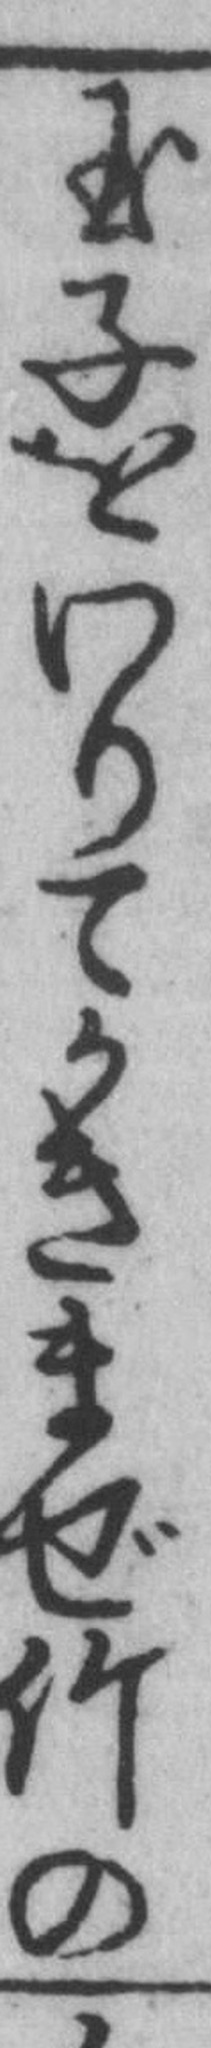玉子をワりてかきまぜ竹の
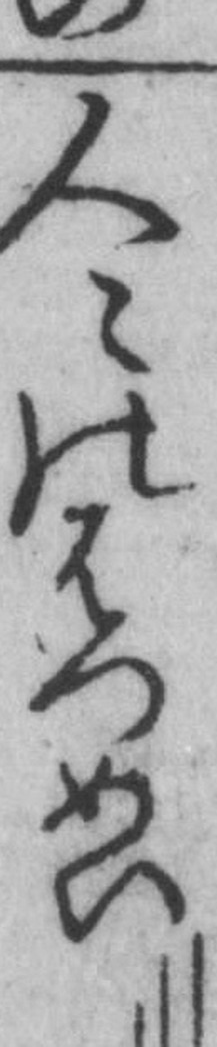人々のはつめい
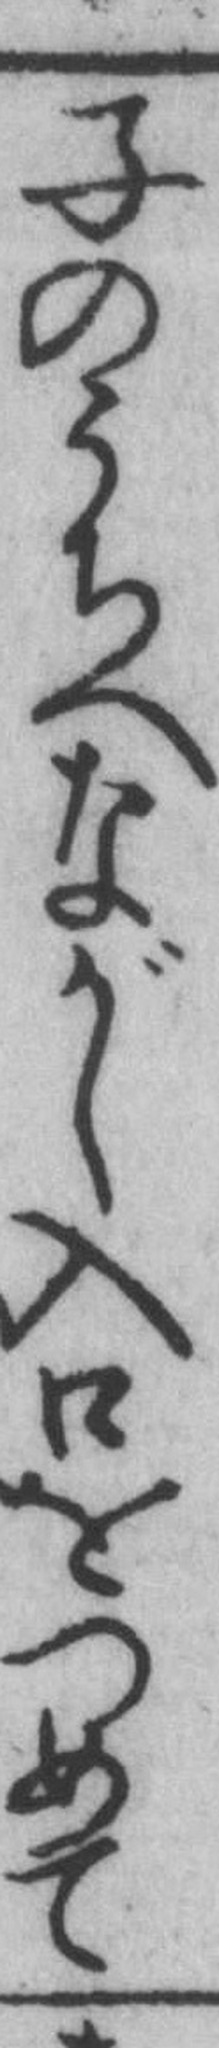うちへながし入口をつめて
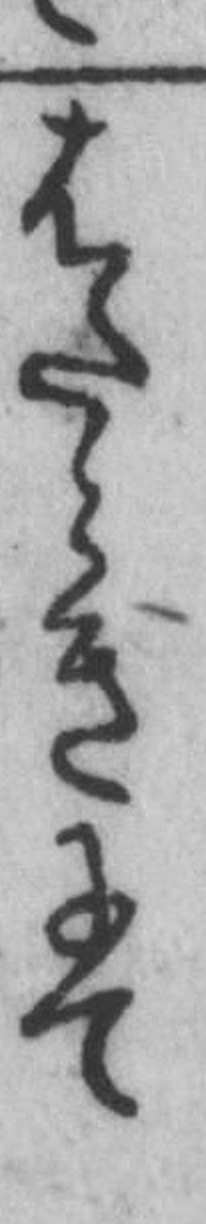はたらきにて
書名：料理献立抄
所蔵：大阪府立大学学術情報センター 国文学研究資料館
